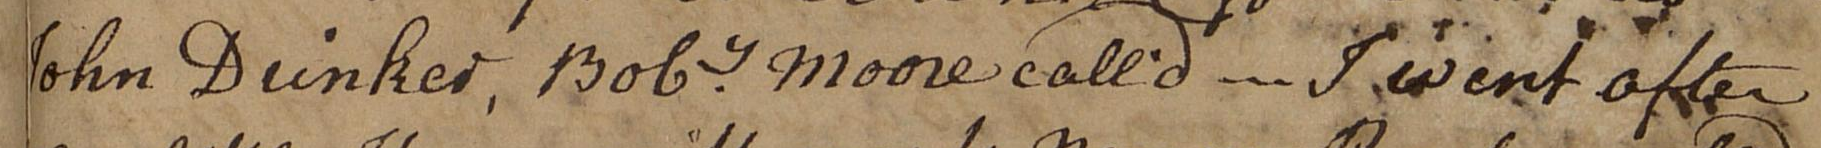John Drinker, Bob.^y Moore call'd- I went after
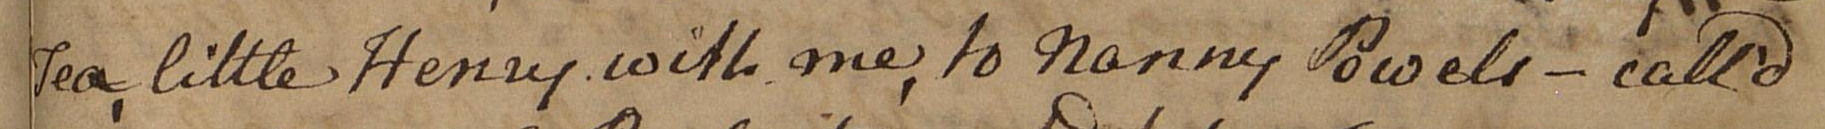Tea, little Henry with me, to Nancy Powels- call'd
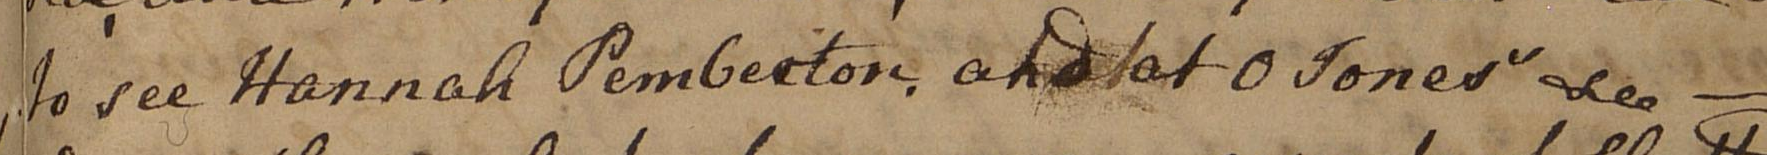to see Hannah Pemberton, and at O Jones^s &c -
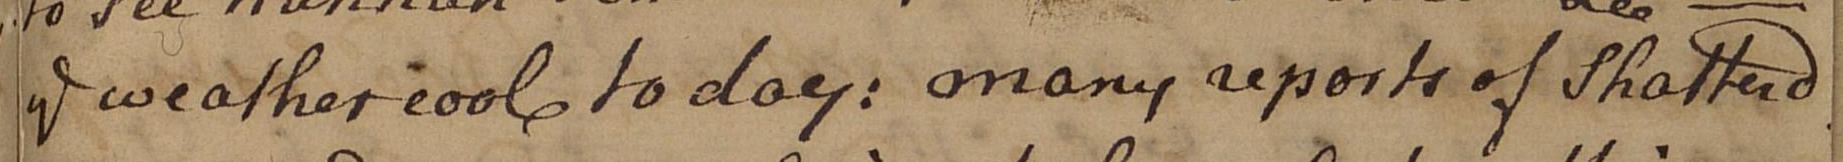y^e weather cool to day: many reports of shatterd
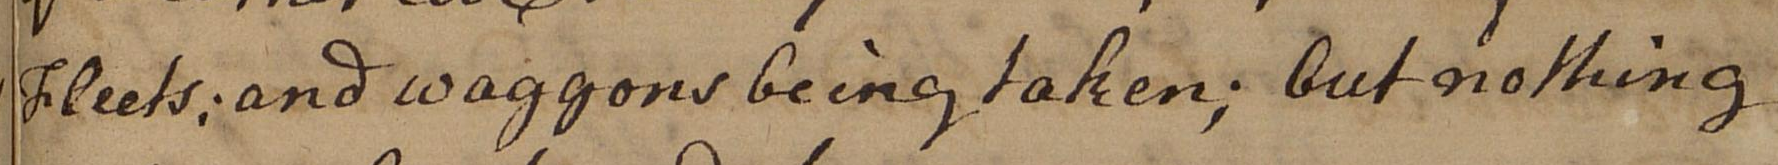fleets; and waggons being taken; but nothing
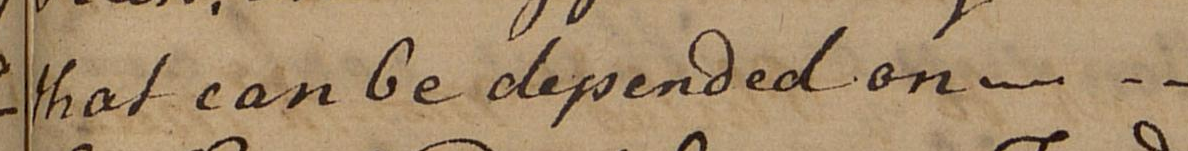that can be depended on--
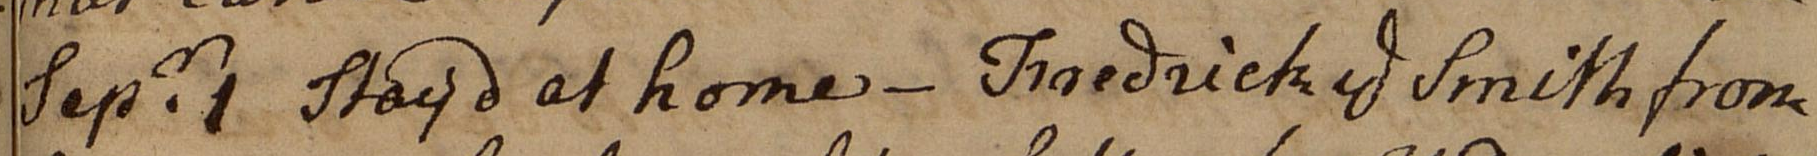Sep^r 1 Stay'd at home- Fredrick y^e Smith from
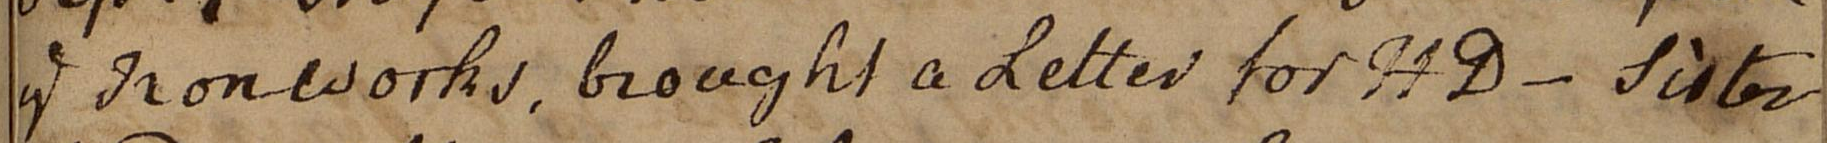y^e Ironworks, brought a Letter for HD- Sister
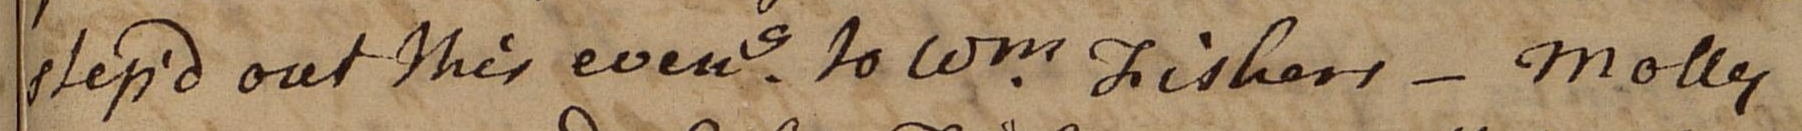step'd out this even^g. to W^m. Fishers- Molly
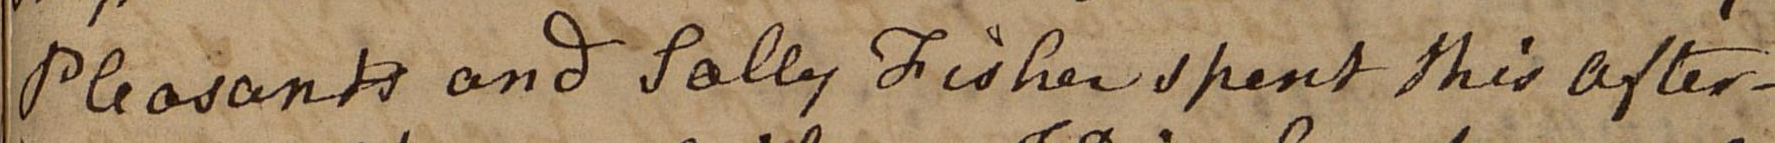Pleasants and Sally Fisher spent this after-
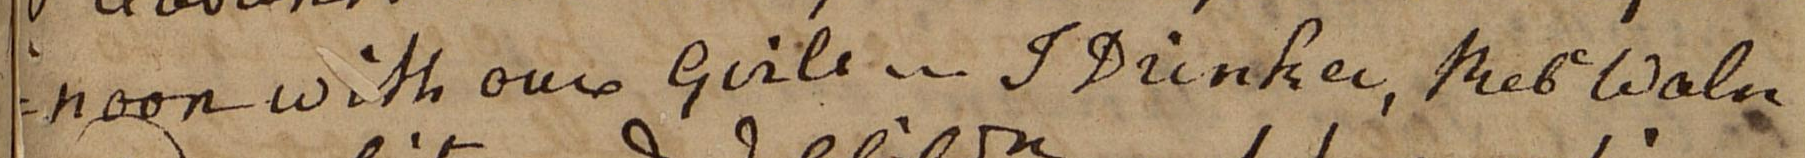-noon with our Girls- J Drinker, Reb^a Waln
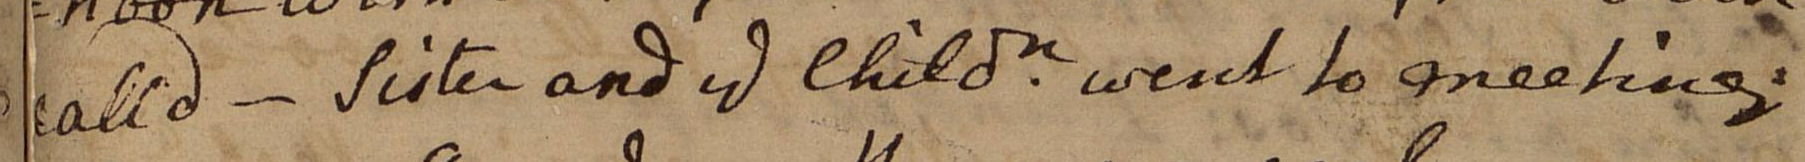call'd- Sister and y^e Child^n. went to meeting
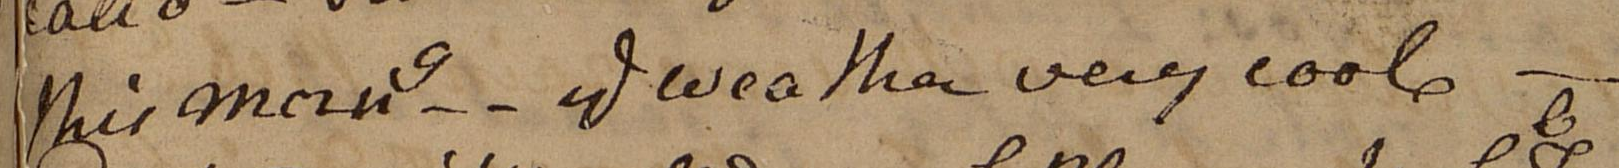this morn^g-- y^e weather very cool.-
